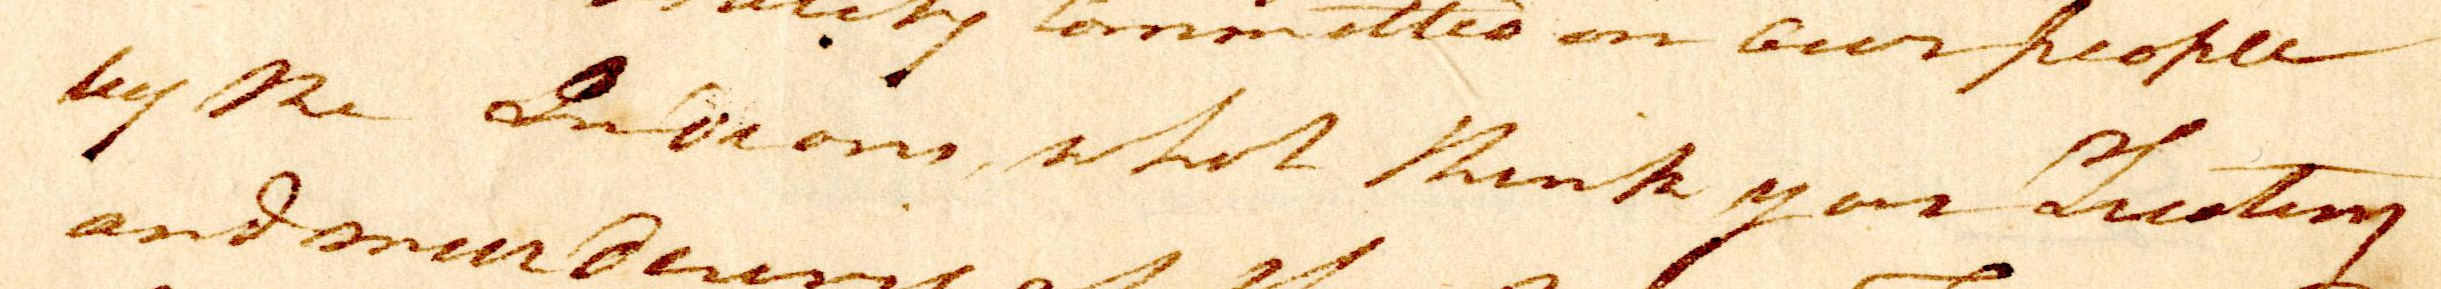by the Indians, what think your Treaty
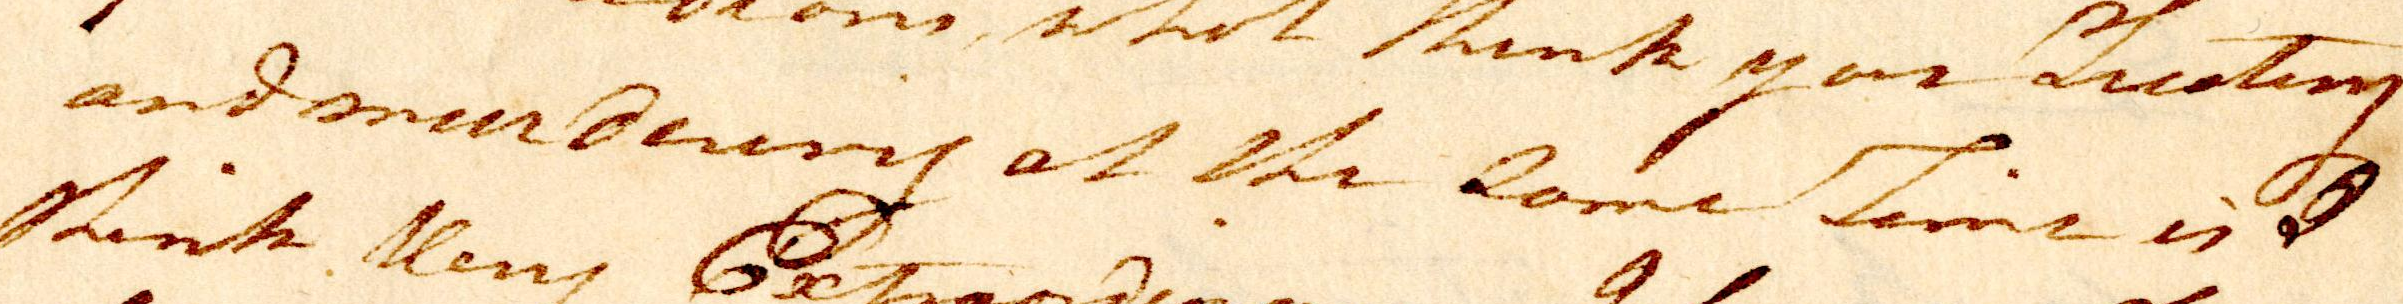and murderery at the same time is I
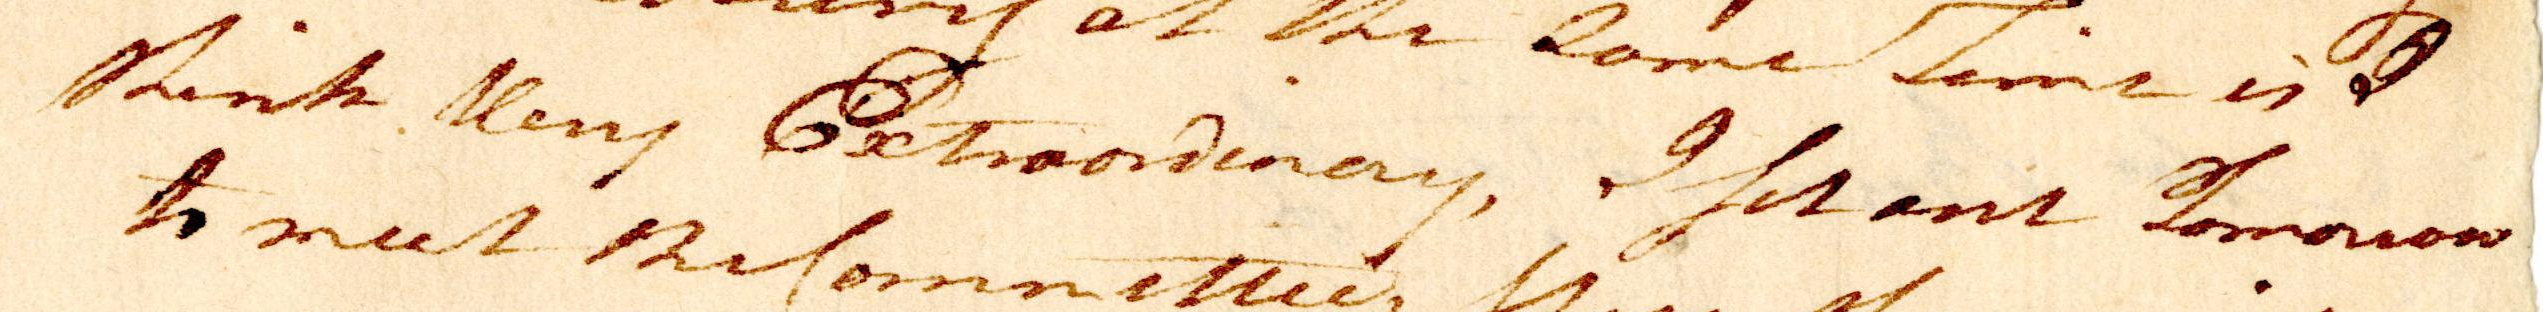think Very Extraordinry, I set out Tomorrow
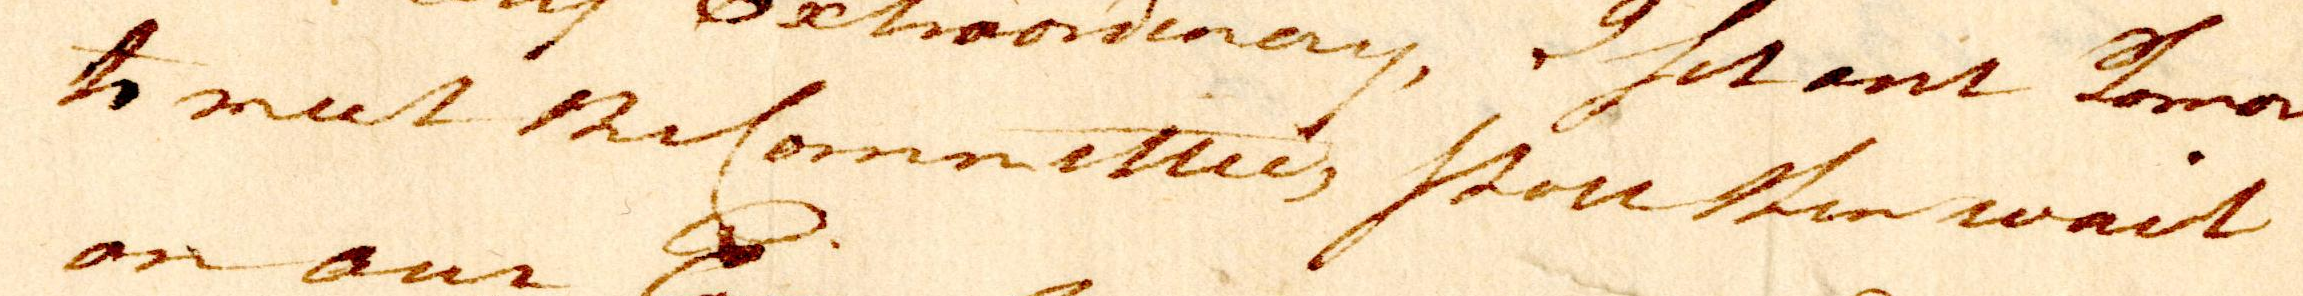to meet the Committee, you then want
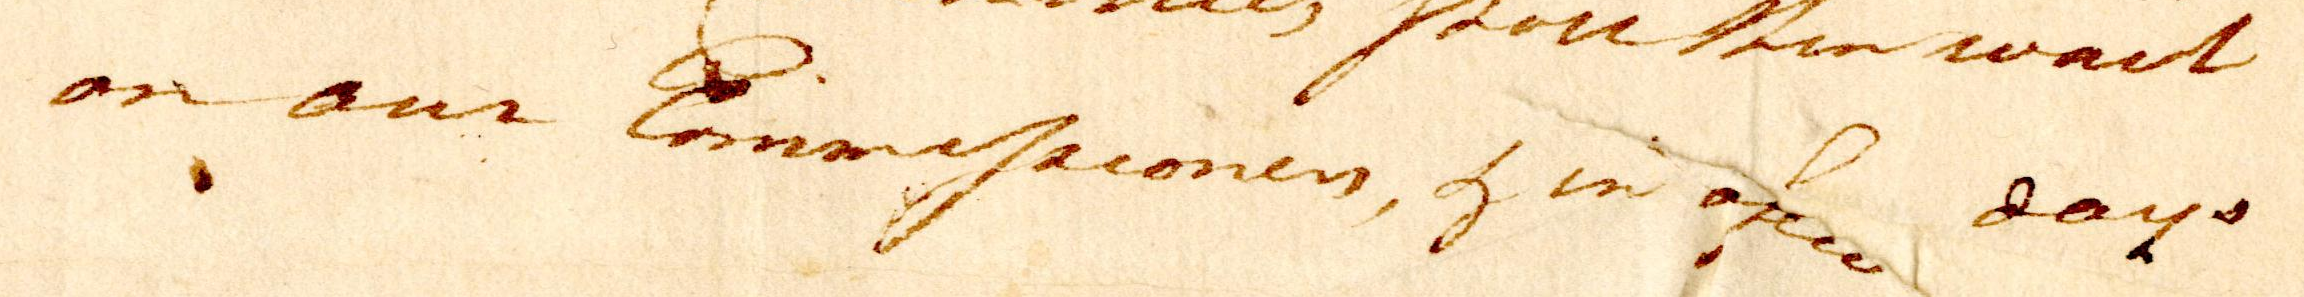on our Commissioners, of in a few days
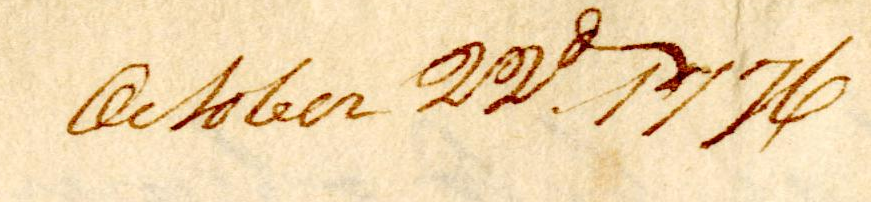October 22^d. 1776
